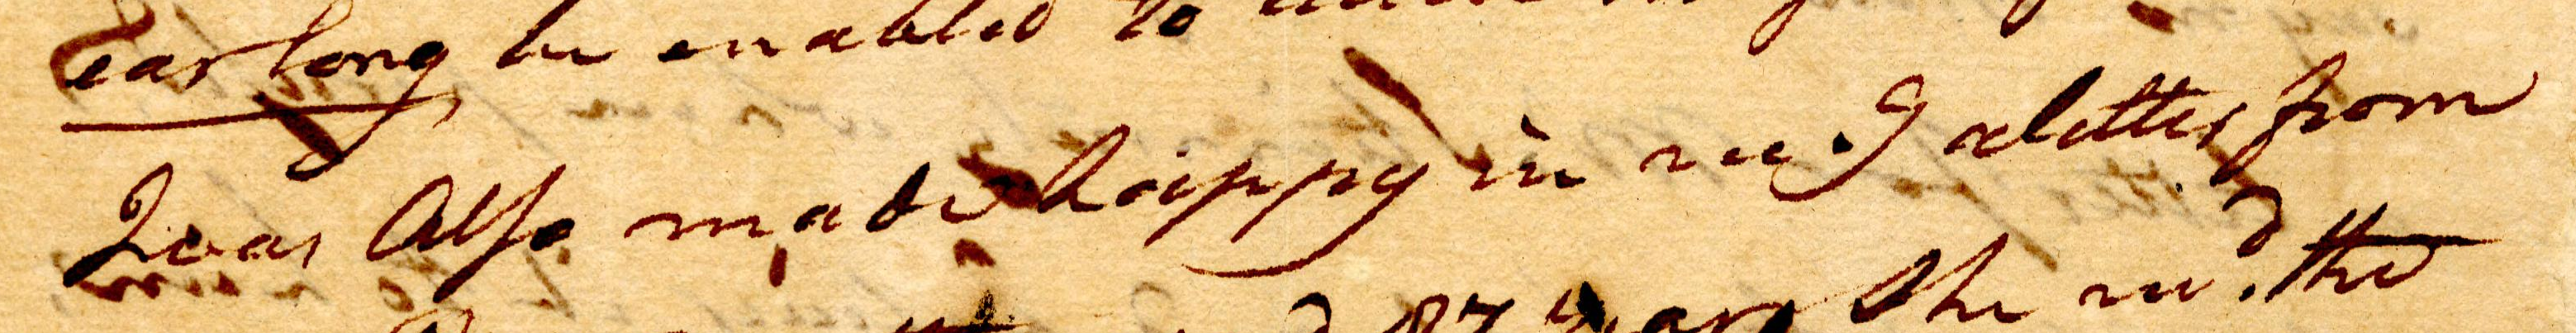I was Also made happy in rec^g. a letter from
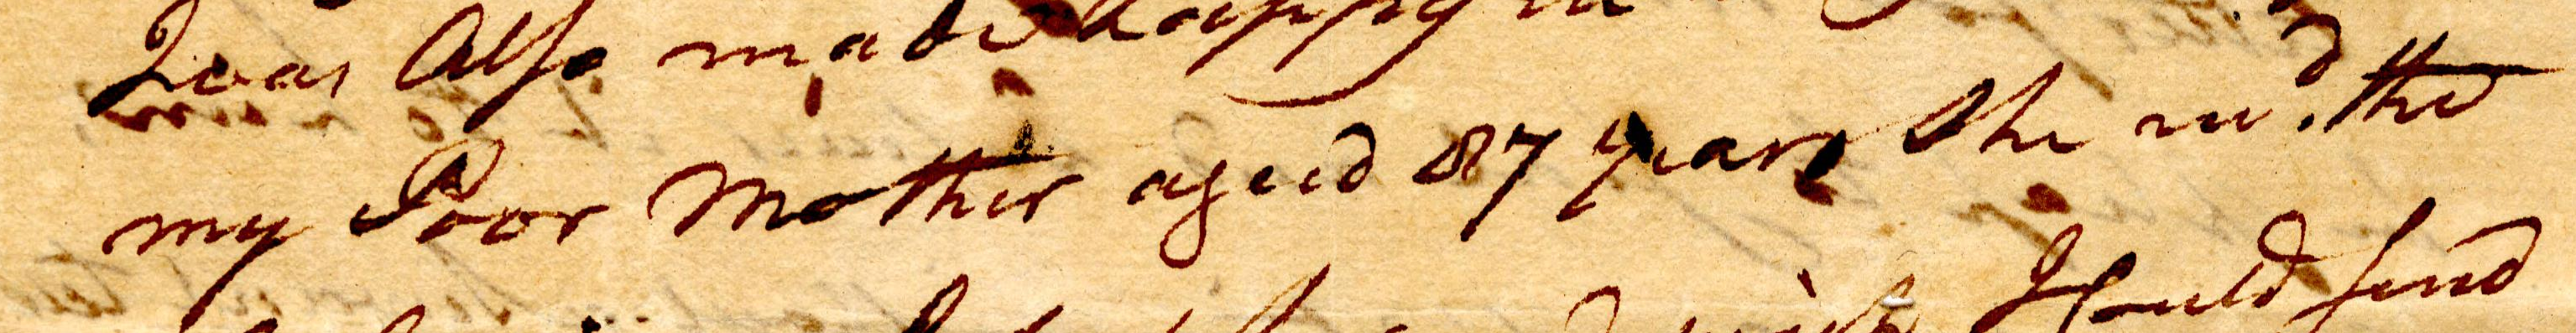my poor mother aged 87 years she rec^d the
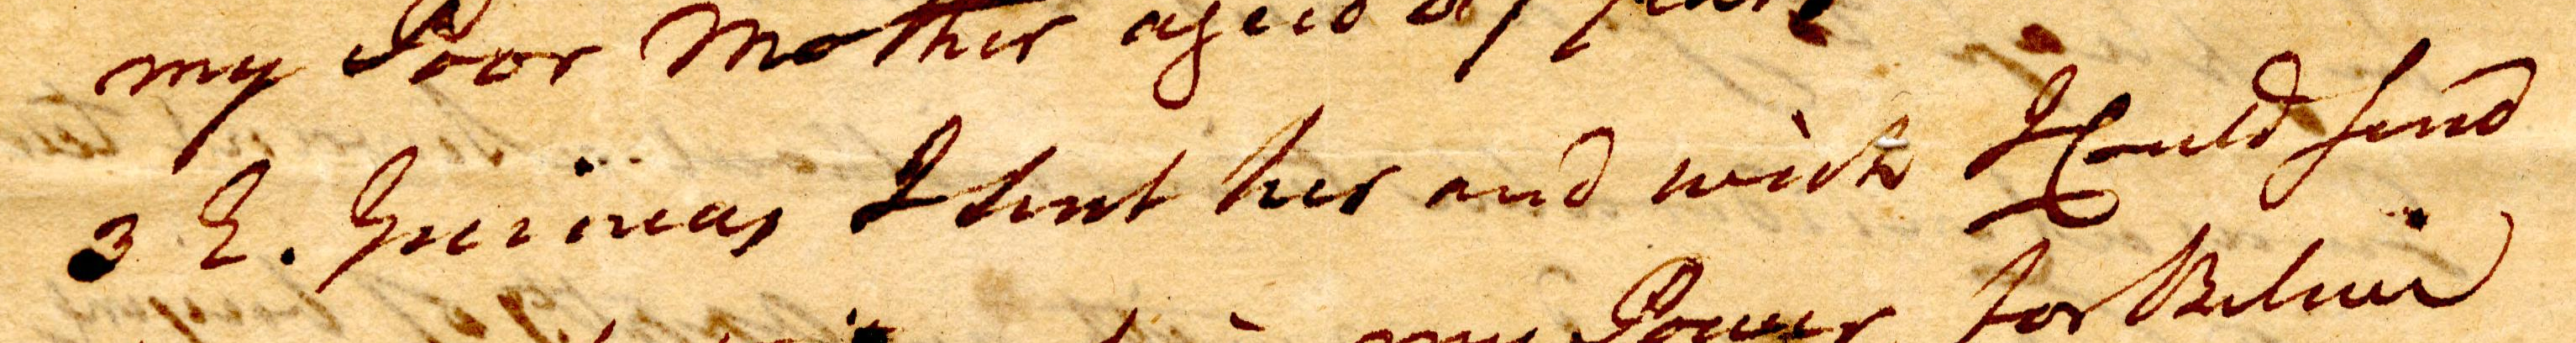3 E. Guineas I sent her and wish I Could send
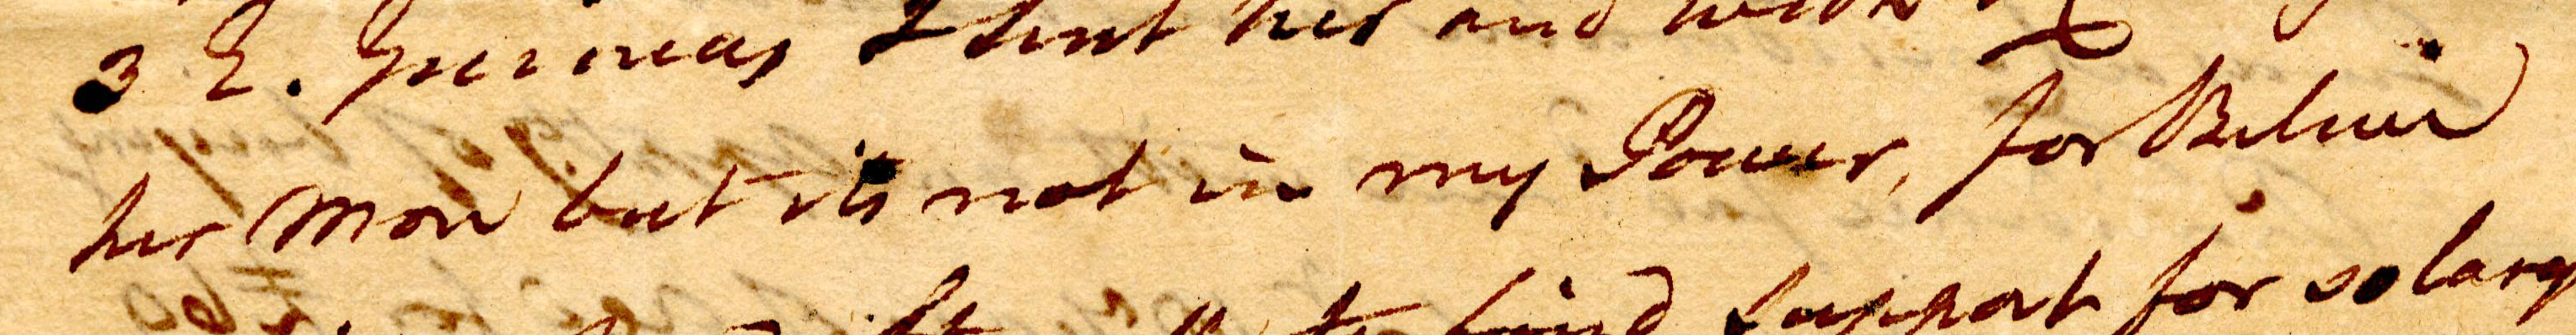her more but its not in my Power, for Believe
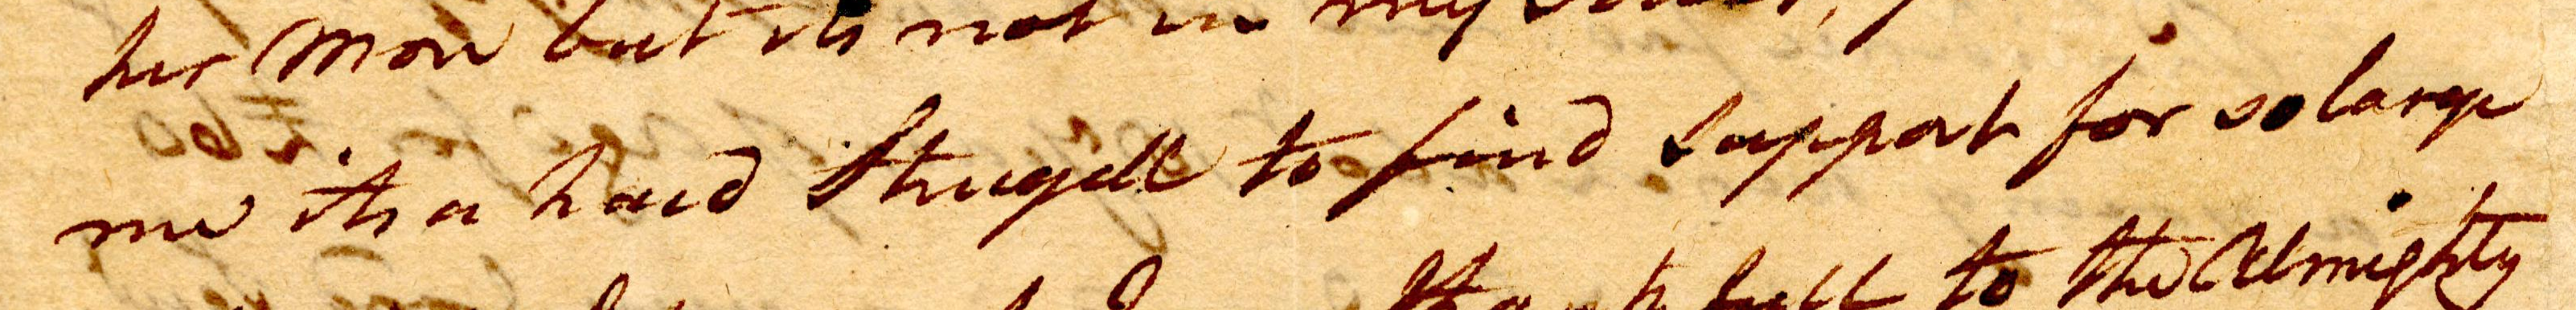me its an hard Strugall tor find Support for so large
